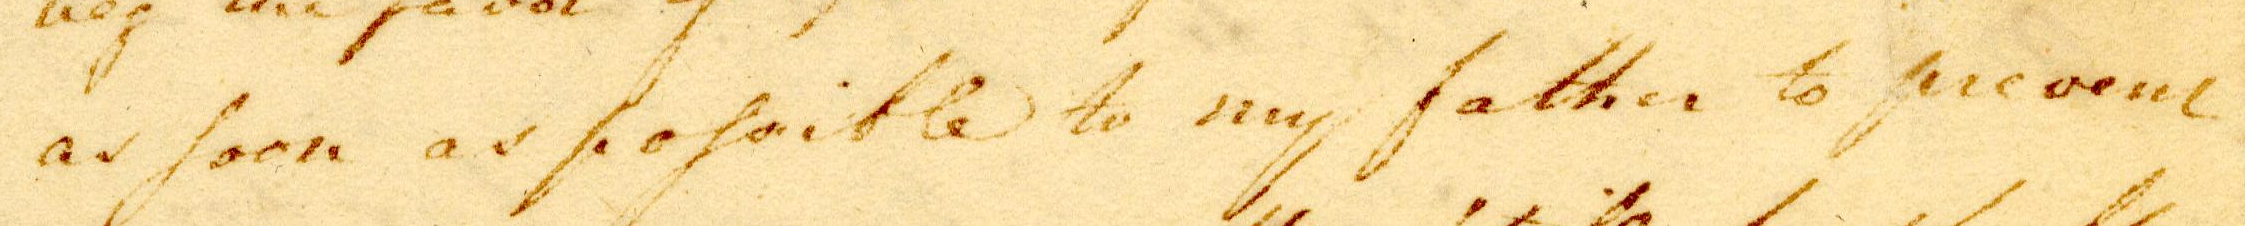as soon as possible to my father to prevent
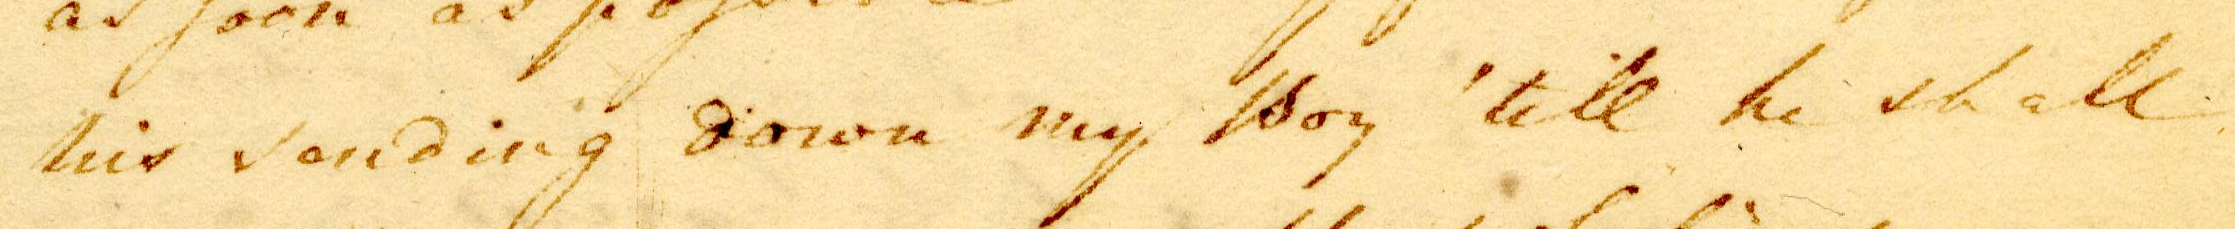his sending down my Boy 'till he shall
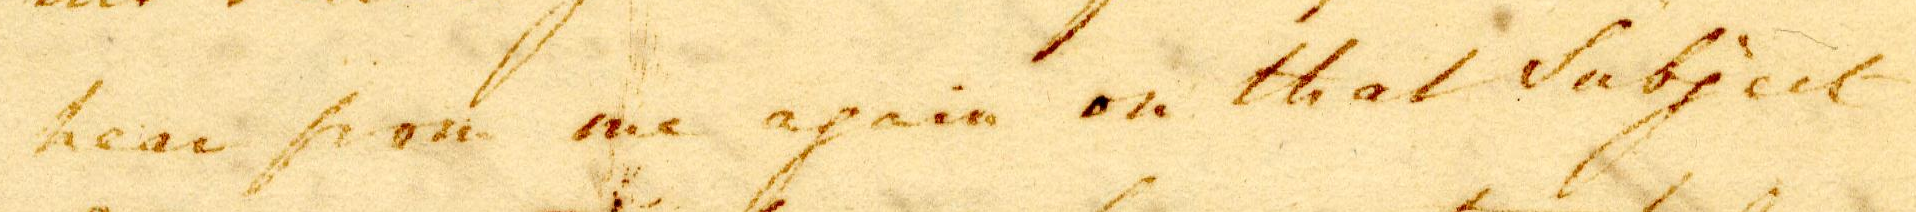hear from me again on that Subject
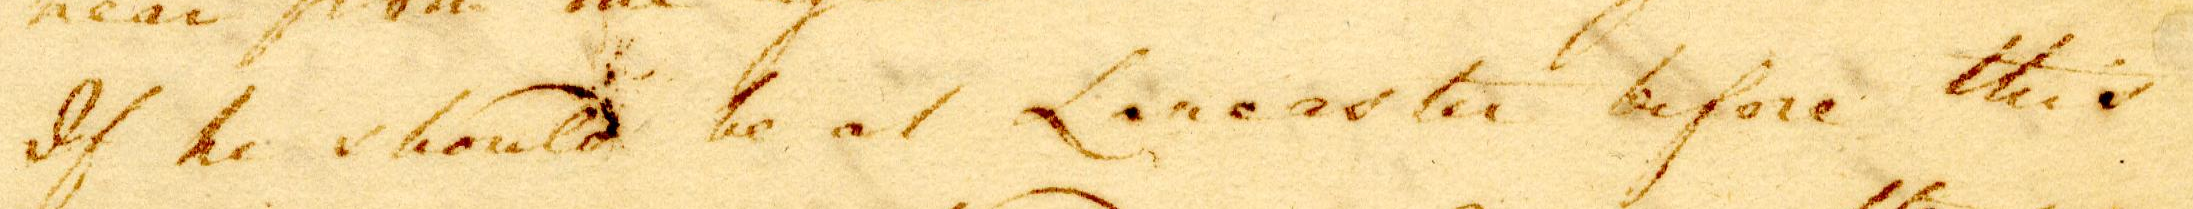If he should be at Lancaster before this
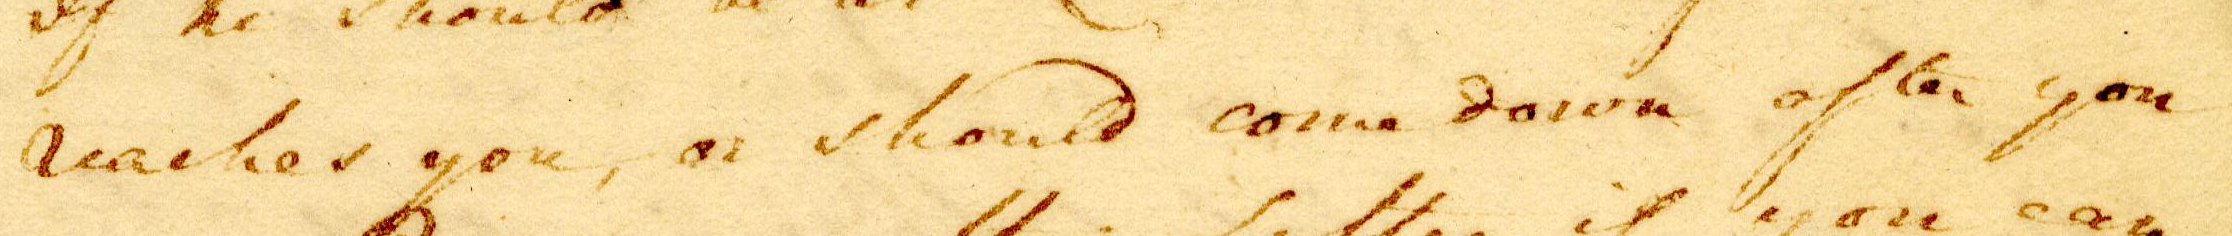reaches you, or should come down after you
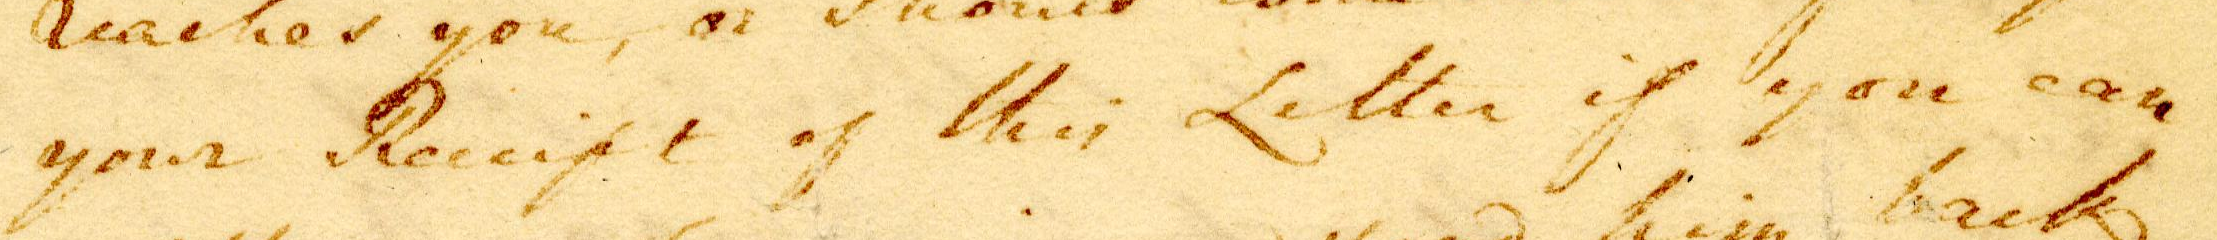your Receipt of this Letter if you can
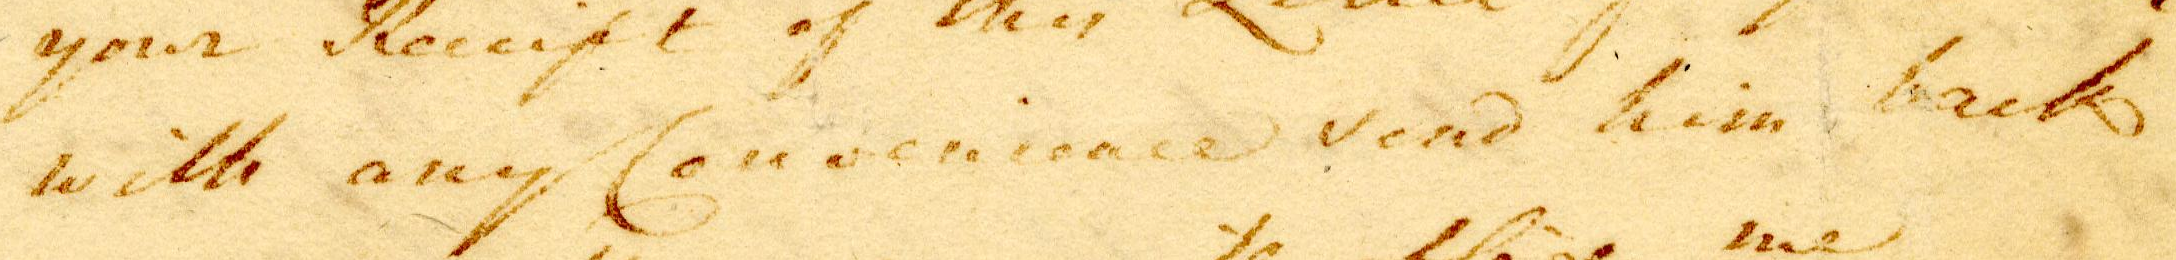will any Convenience send him back
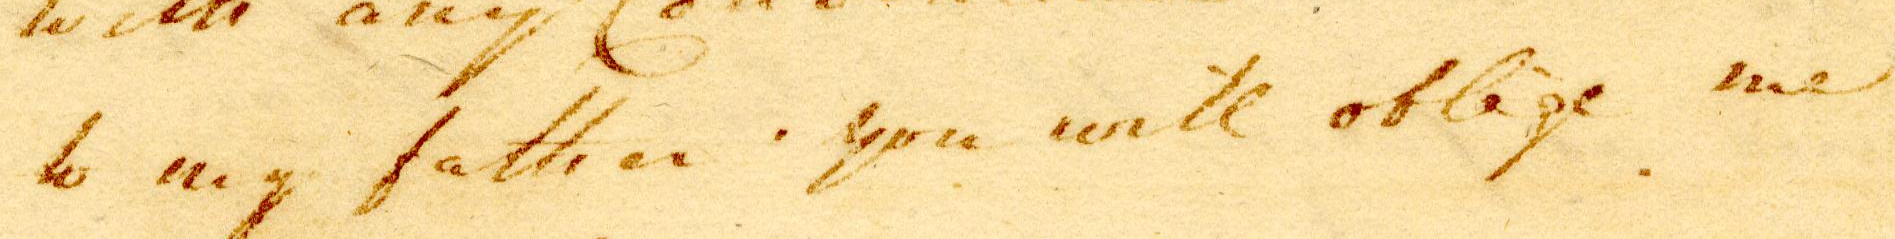to my father You will oblige me
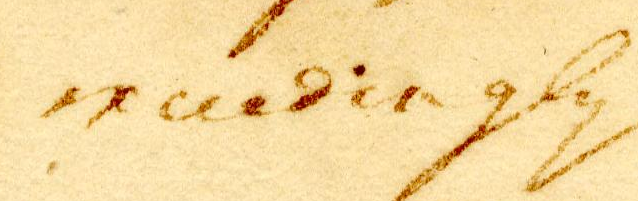exceedingly
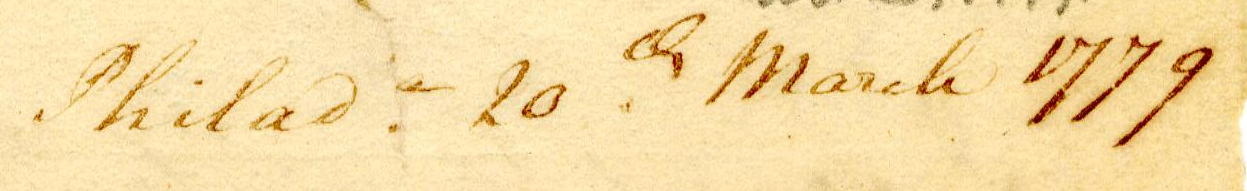Philad^a: 20 March 1779
